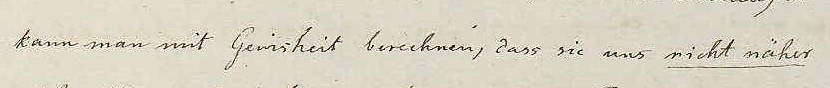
kann man mit Gewisheit berechnen, dass sie uns nicht näher
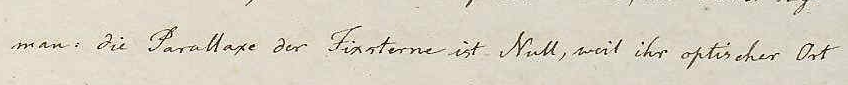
man: die Parallaxe der Fixsterne ist Null, weil ihr optischer Ort
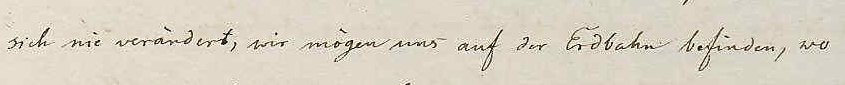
sich nie verändert, wir mögen uns auf der Erdbahn befinden, wo
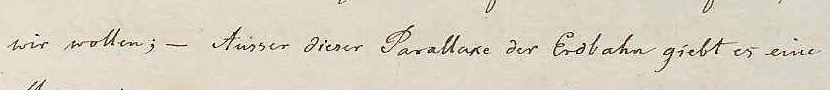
wir wollen; – Ausser dieser Parallaxe der Erdbahn giebt es eine
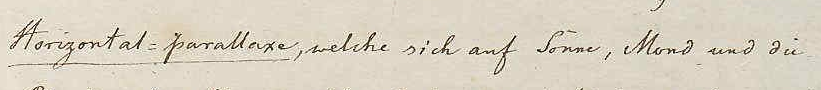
Horizontal-parallaxe, welche sich auf Sonne, Mond und die
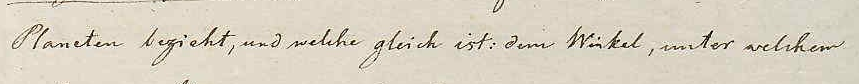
Planeten bezieht, und welche gleich ist: dem Winkel, unter welchem
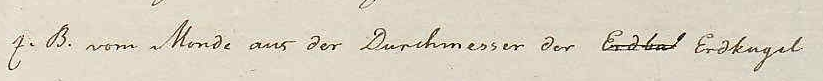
z. B. vom Monde aus der Durchmesser der Erdbal Erdkugel
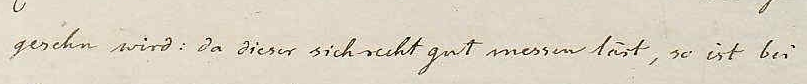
gesehn wird: da dieser sich recht gut messen läst, so ist bei
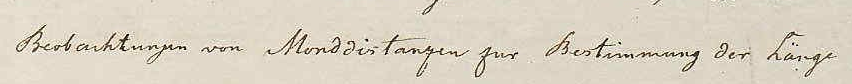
Beobachtung von Monddistanzen zur Bestimmung der Länge
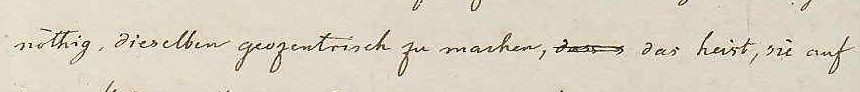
nöthig, dieselben geozentrisch zu machen, dass s das heist, sie auf
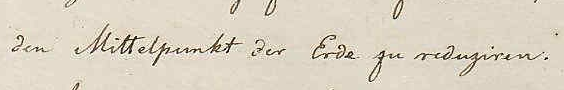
den Mittelpunkt der Erde zu reduziren.
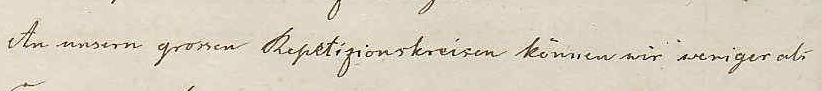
An unsern grossen Repetizionskreisen können wir weniger als
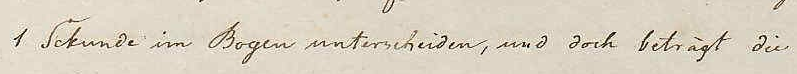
1 Sekunde in Bogen unterscheiden, und doch beträgt die
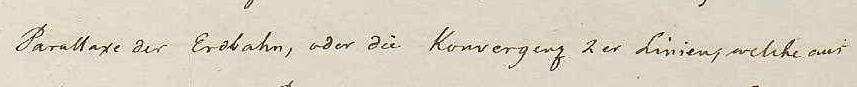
Parallaxe der Erdbahn, oder die Konvergenz 2er Linien, welche aus
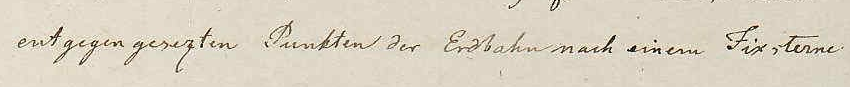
entgegen gesezten Punkten der Erdbahn nach einem Fixsterne
